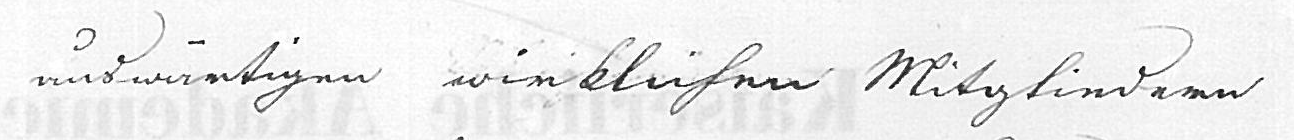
auswärtigen wirklichen Mitgliedern
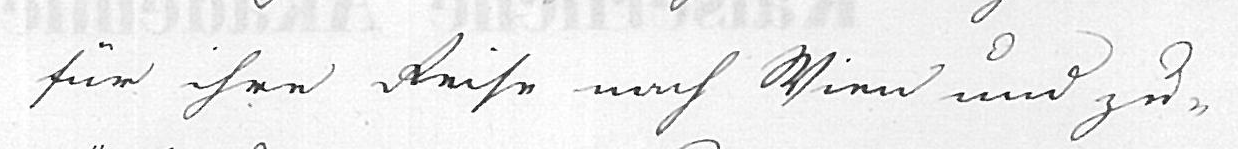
für ihre Reise nach Wien und zu-
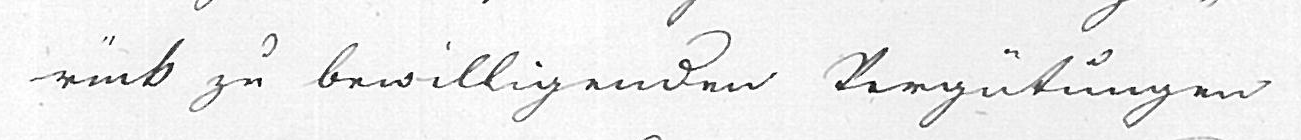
rück zu bewilligenden Vergütungen
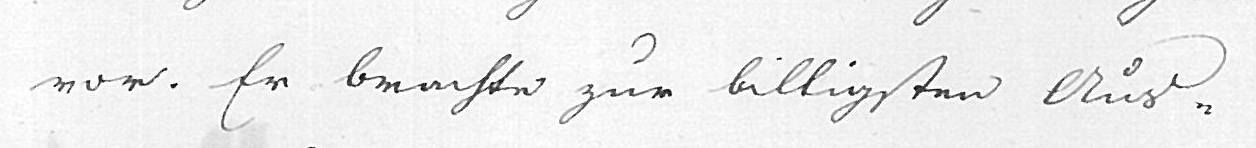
vor. Er brachte zur billigsten Aus-
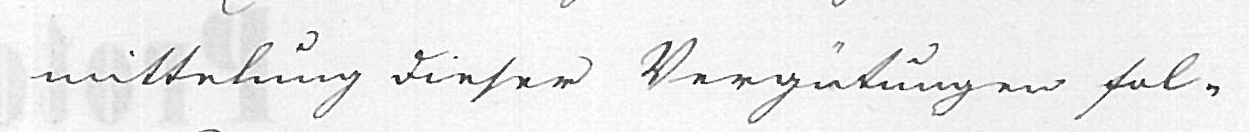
mittelung dieser Vergütungen fol-
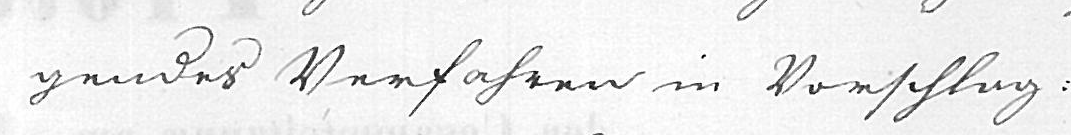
genden Verfahren in Vorschlag:
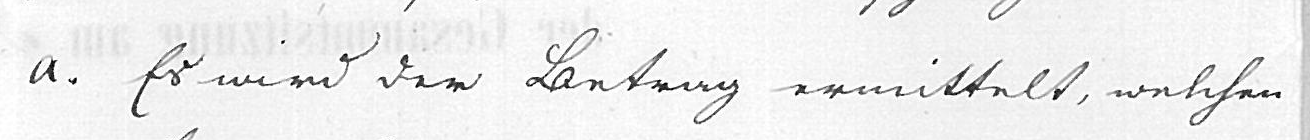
a. Es wird der Betrag ermittelt, welchen
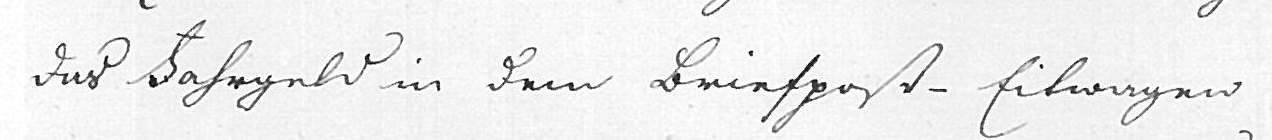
das Fahrgeld in dem Briefpost-Eilwagen
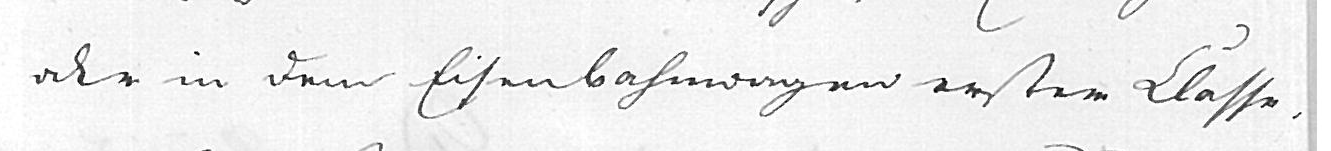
oder in dem Eisenbahnwagen erster Classe
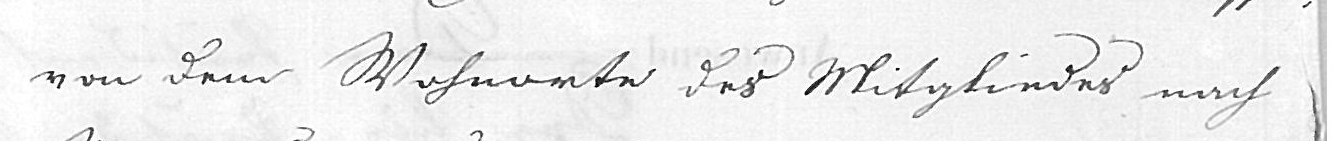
von dem Wohnorte des Mitgliedes nach
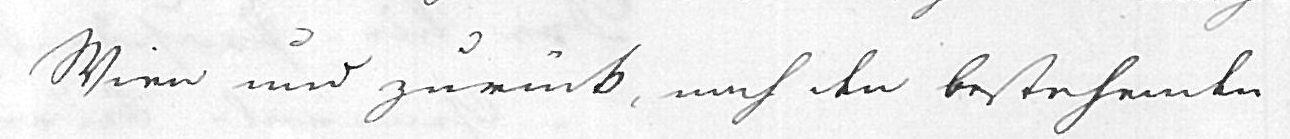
Wien und zurück, nach den bestehenden
